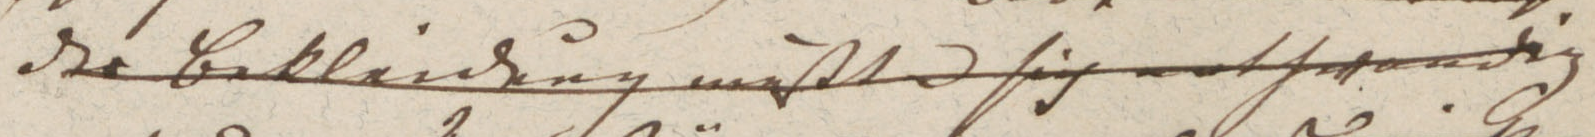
der Bekleidung müsste sich nothwendig
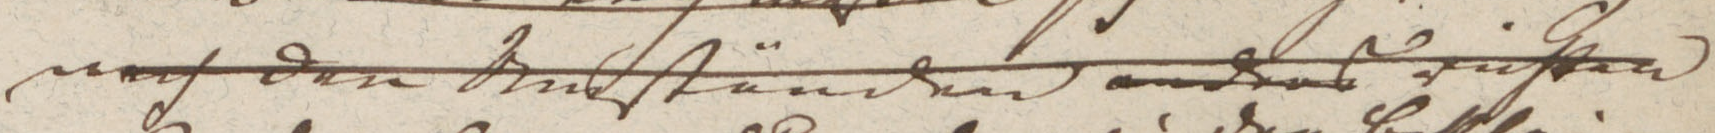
nach den Umständen anders richten
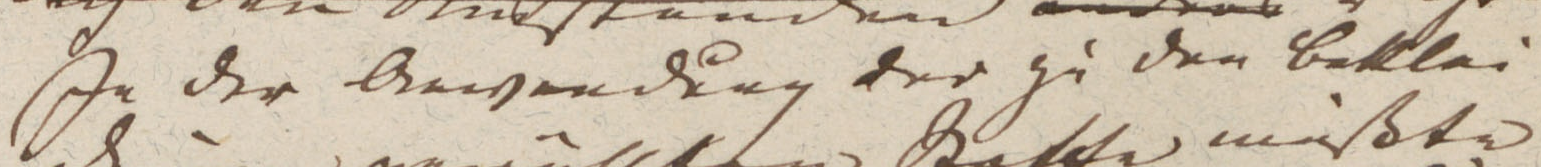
In der Anwendung der zu den Beklei-
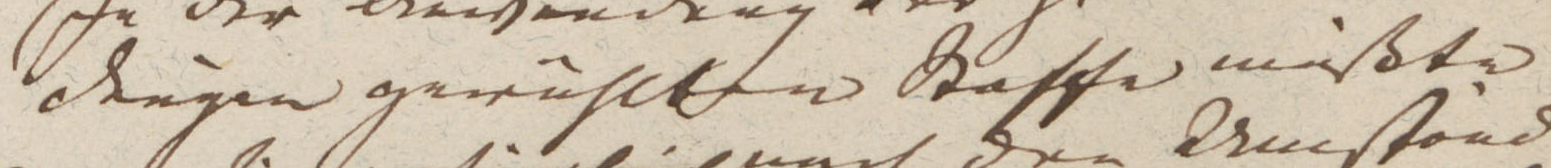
dungen gewählten Stoffe musste
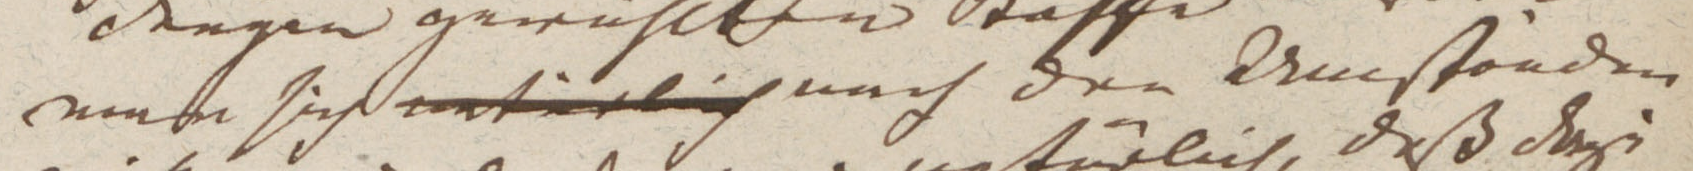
man sich natürlich nach den Umständen
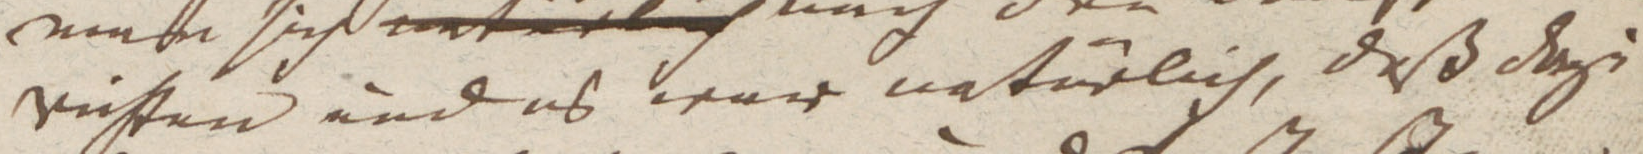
richten und es war natürlich, dass dazu
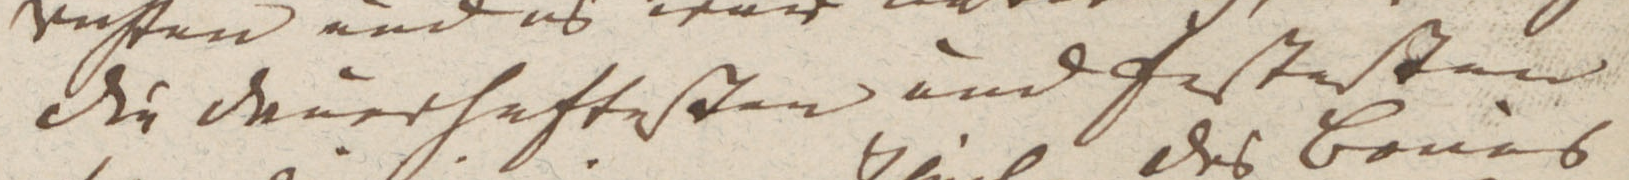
die dauerhaftesten und festesten
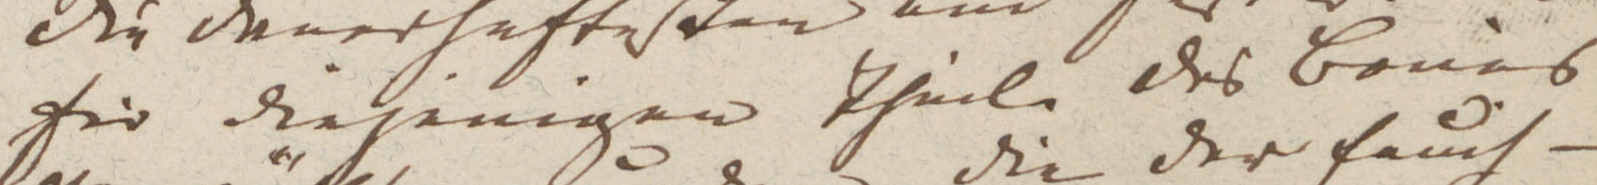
für diejenigen Theile des Baues
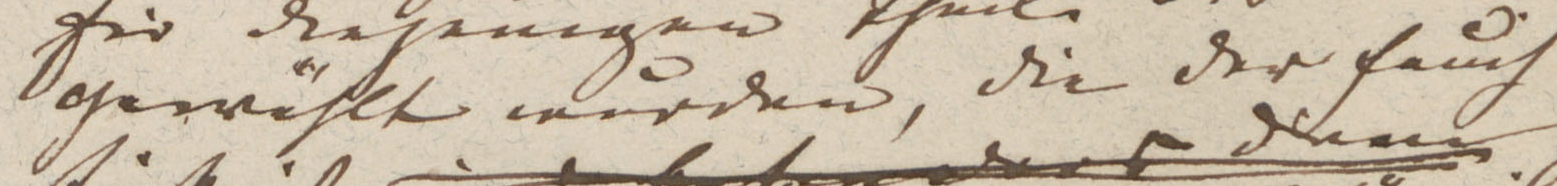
gewählt wurden, die der Feuch-
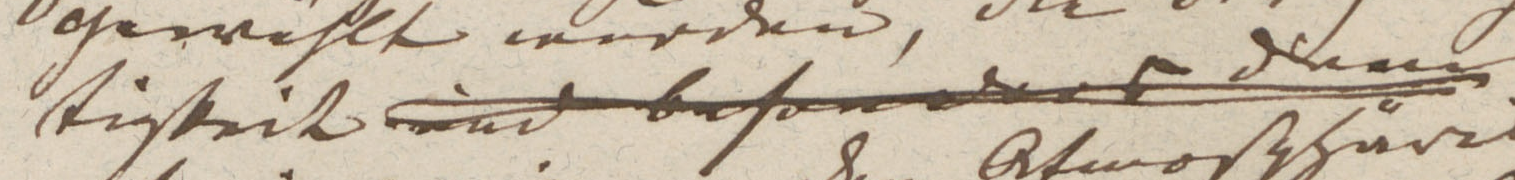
tigkeit und besonders dem
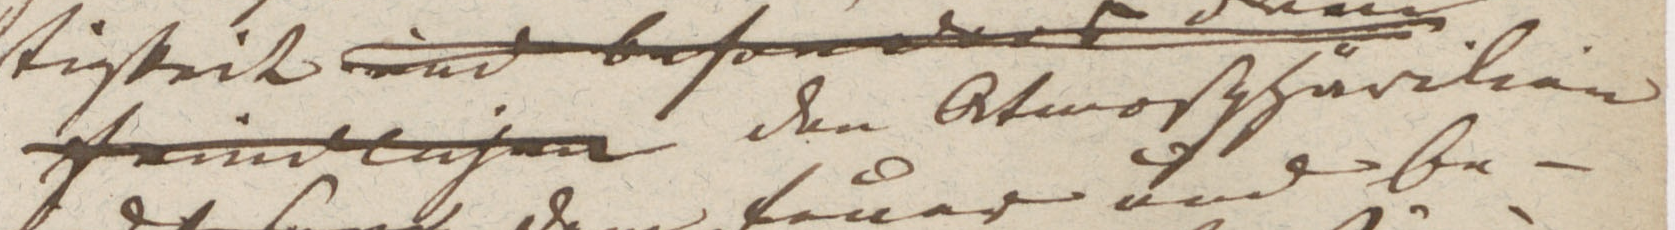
feindlichen den Atmosphärilien
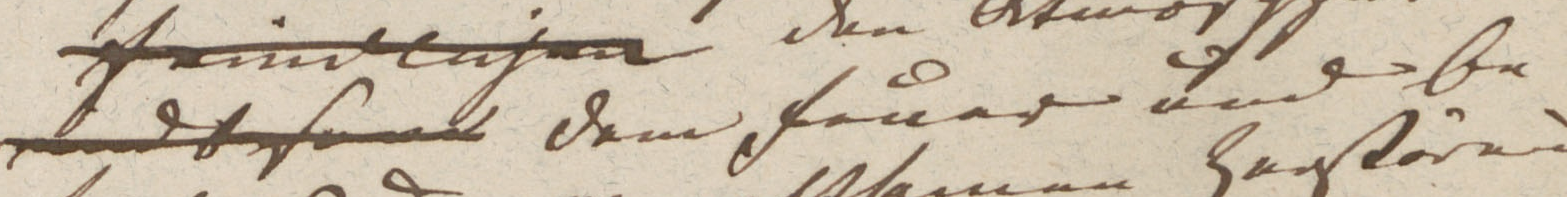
und besond dem Feuer und be-
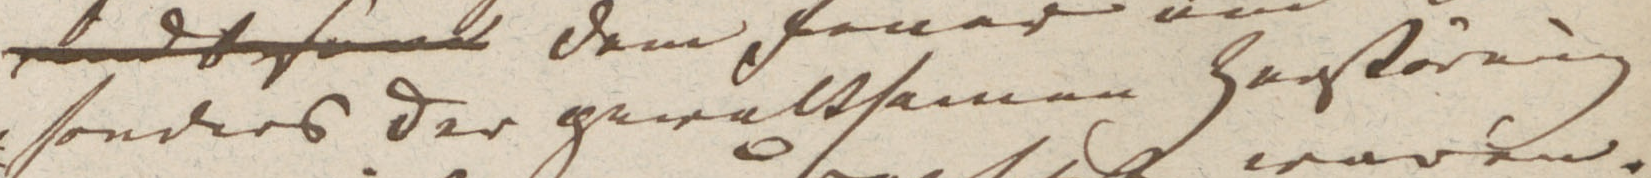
sonders der gewaltsamen Zerstörung
